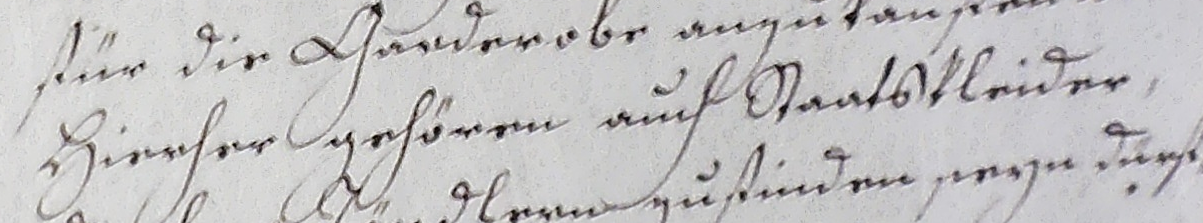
Herher gehören auch Staatskleider,
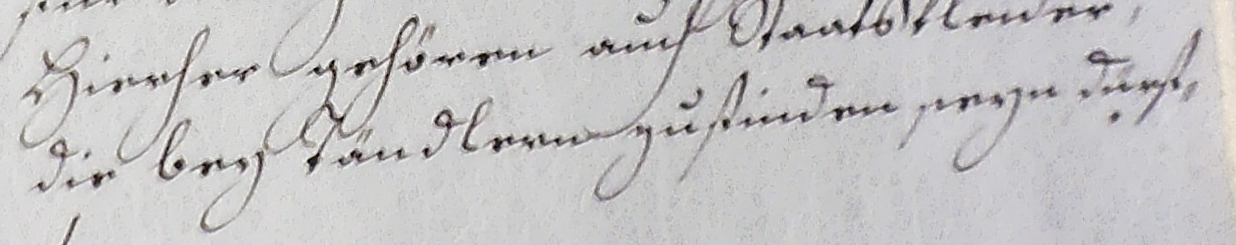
die bey Tändlern zufinden seyn dürf¬
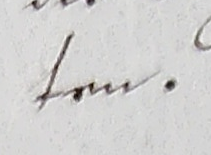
ten.
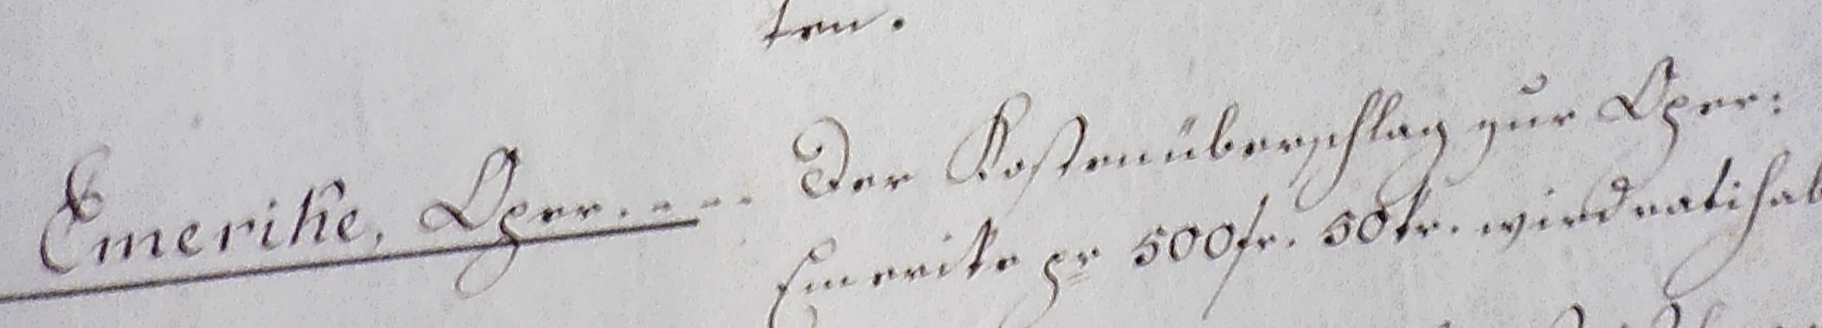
Emerike, Oper. .. .. . Der Kostenüberschlag zur Oper:
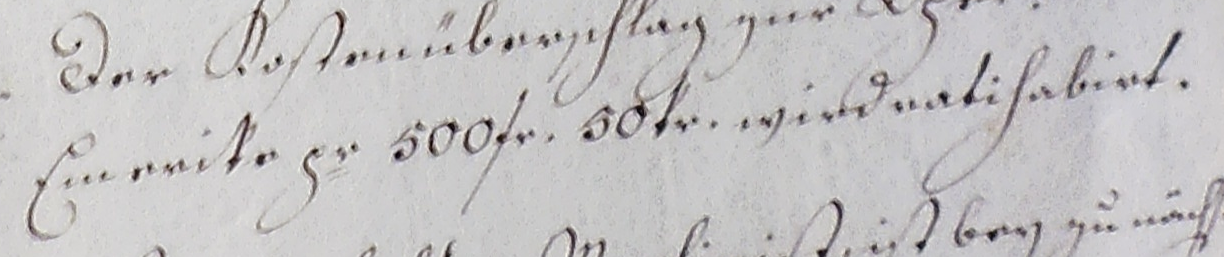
Emerike pr͇ 500fr. 50kr. wird ratihabirt.
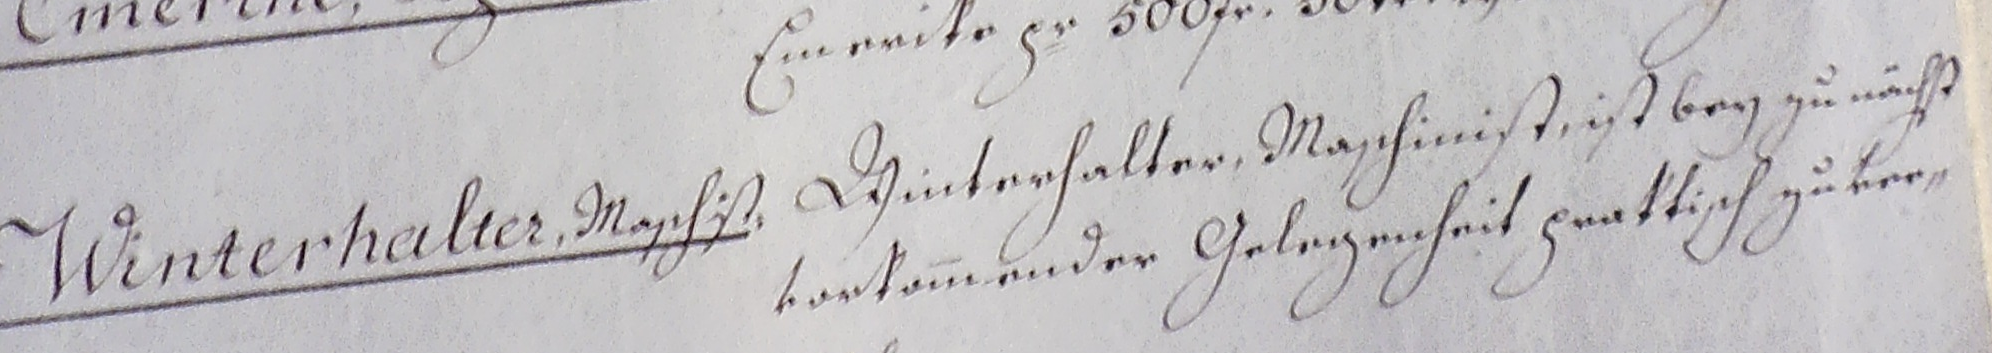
Winterhalter, Maschist. Winterhalter Maschinist, ist bey zu nächst
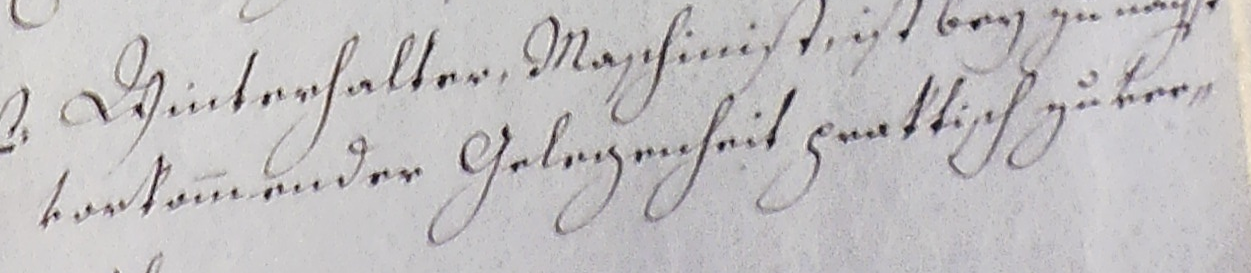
vorkom̅ender Gelegenheit praktisch zu ver¬
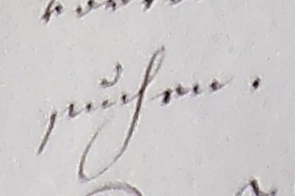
suchen.
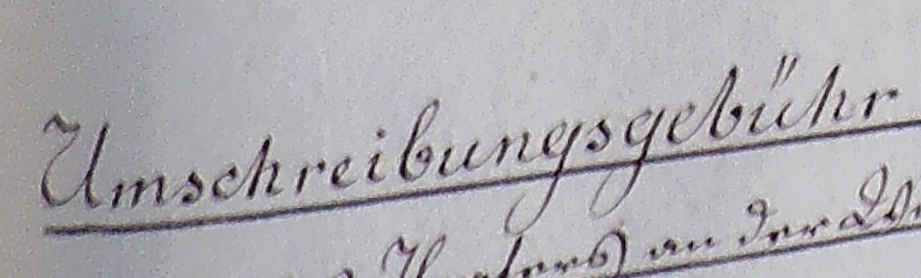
Umschreibungsgebühr
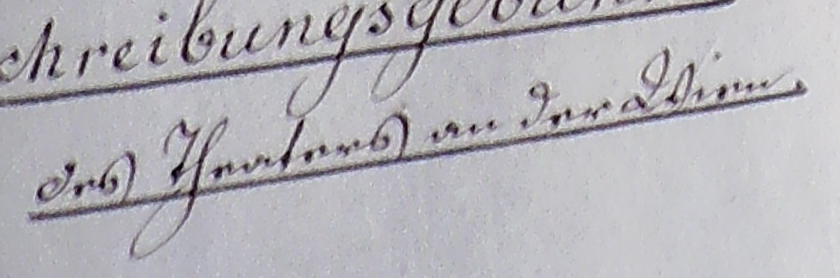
des Theaters an der Wien.
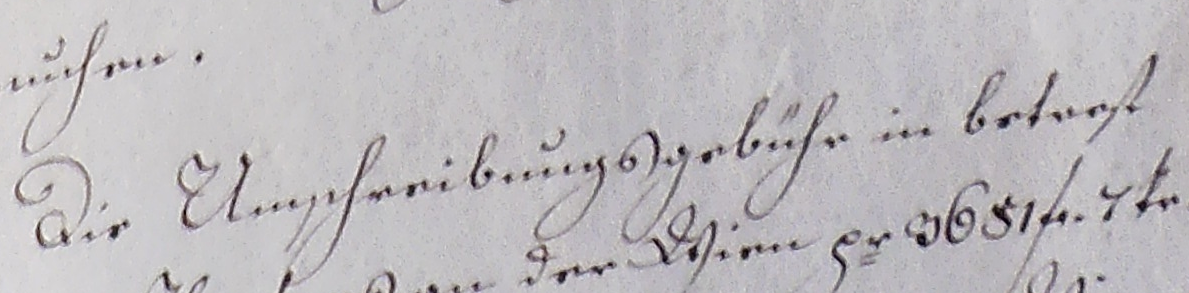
Die Umschreibungsgebühr in betref
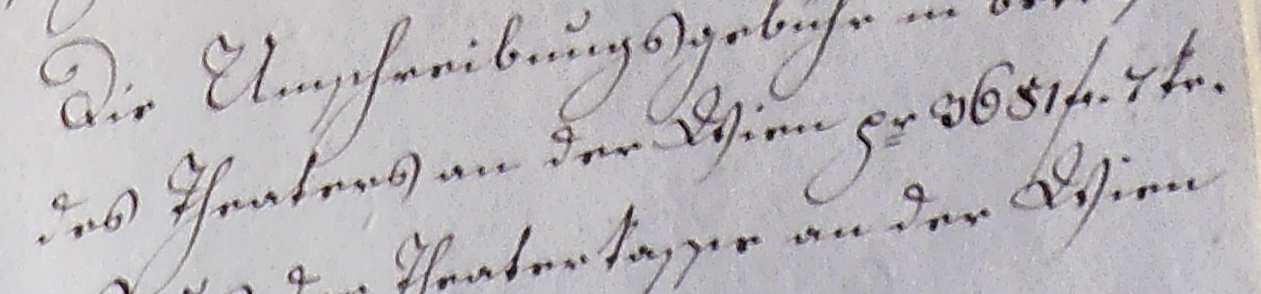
des Theaters an der Wien pr͇ 3681fr. 7kr.
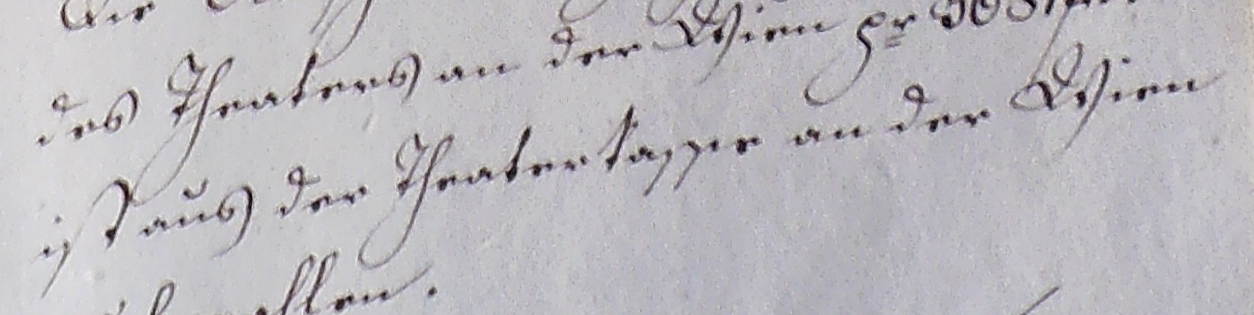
ist aus der Theaterkasse an der Wien
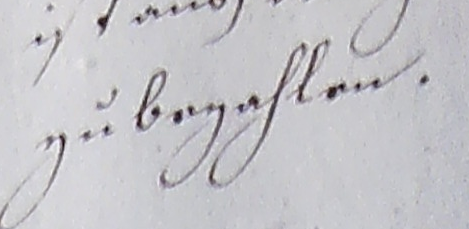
zubezahlen.
